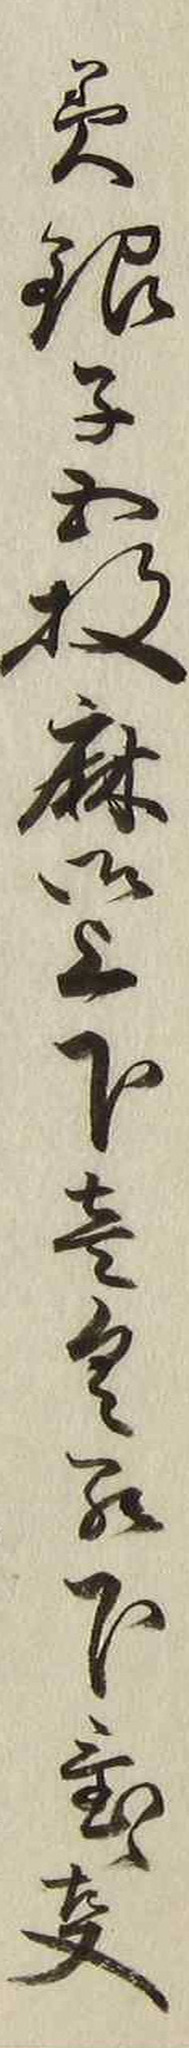美銀子五枚麻御上下壱具被下置候事
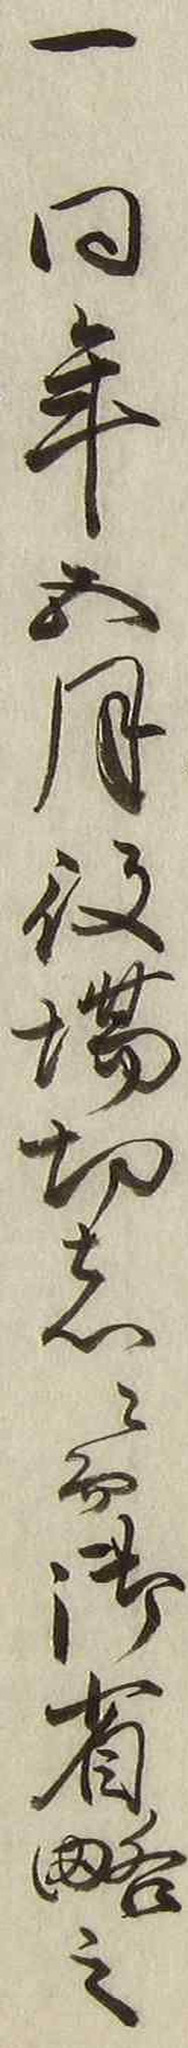一同年五月役場切者ニ而御省略之
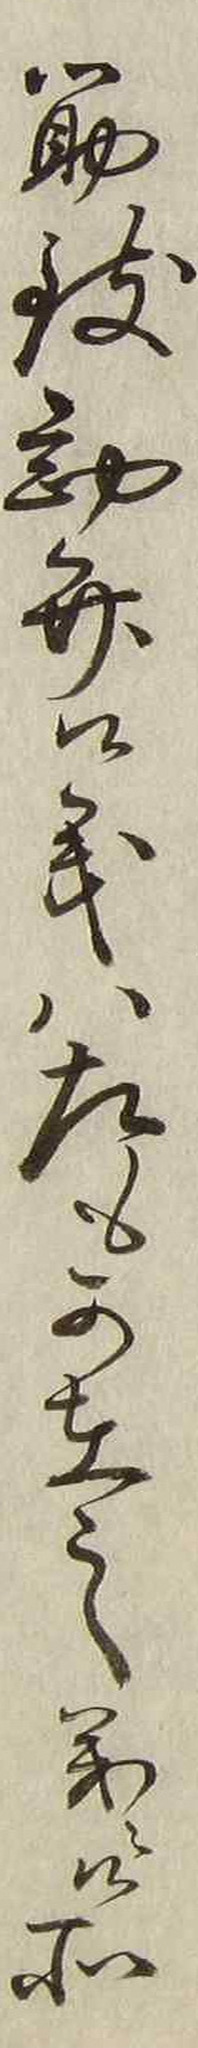筋致勘弁候義ハ左も可在之義ニ候所
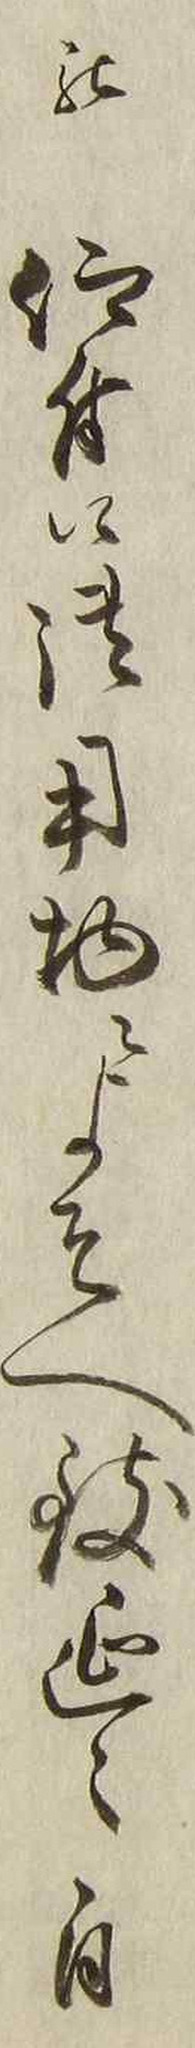被仰付候御用物ニよそへ致延々自

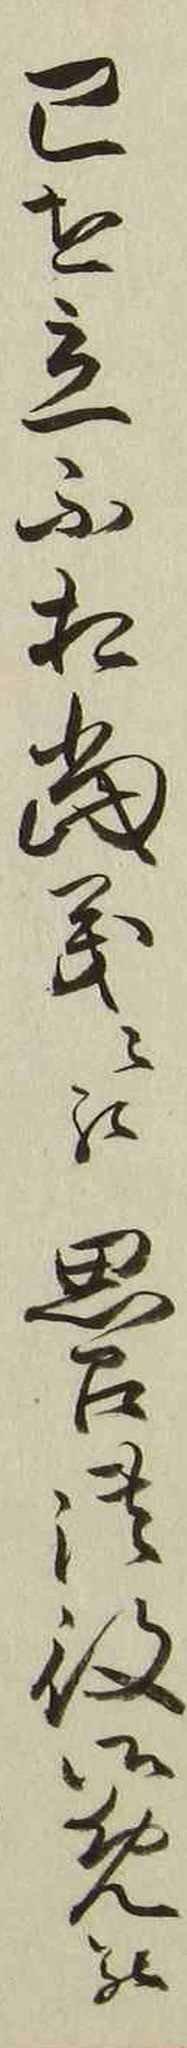已を立不相当義ニ被思召御役御免被
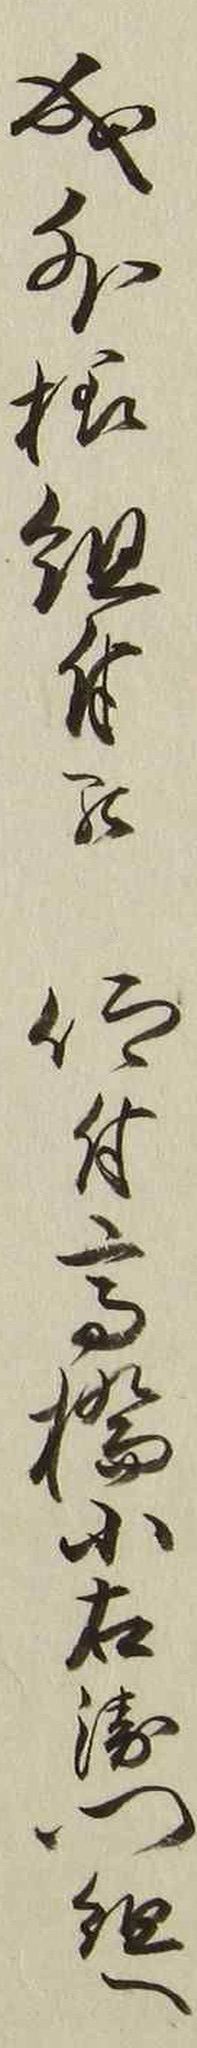成外様組付被仰付高橋小右衛門組へ
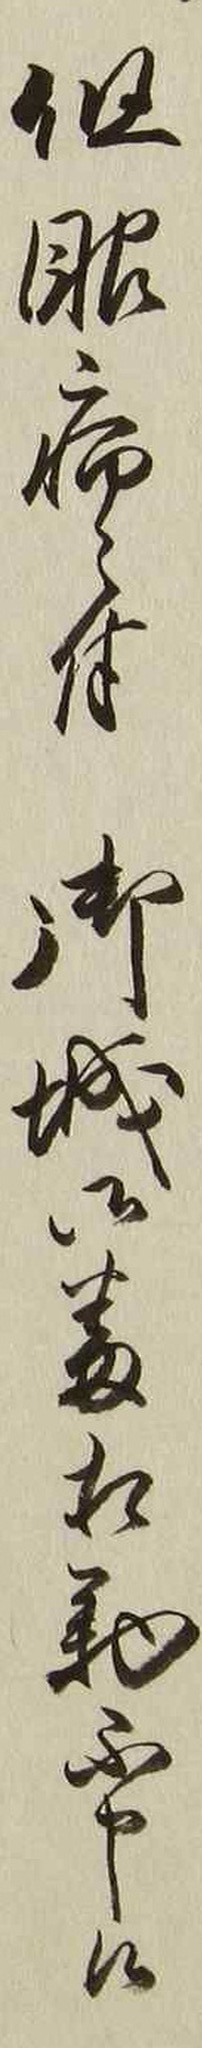但眼病ニ付御城御番相勤不申候
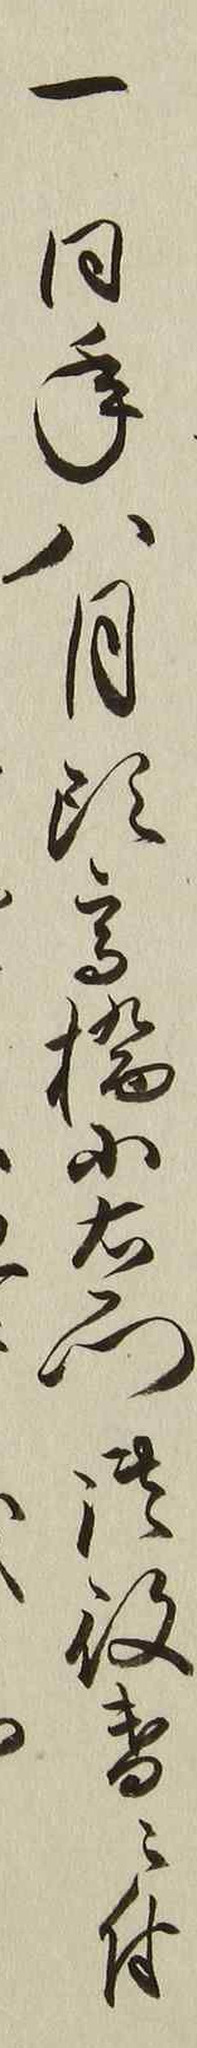一同年八月頭高橋小右衛門御役替ニ付
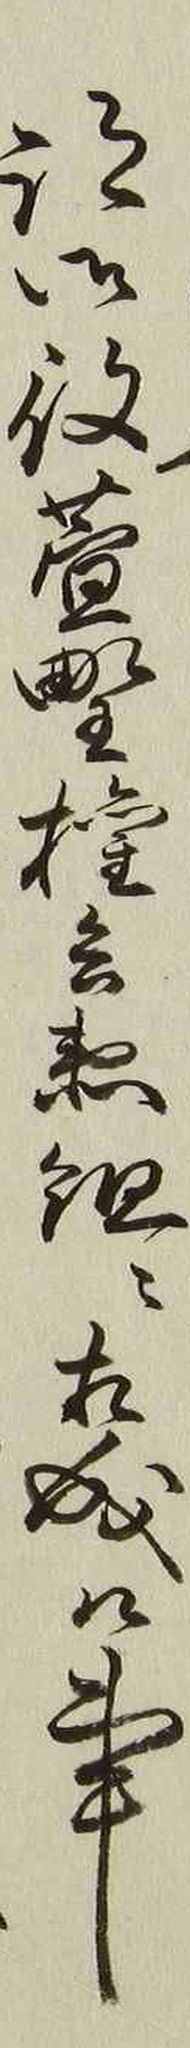跡御役萱野権兵衛組ニ相成候事
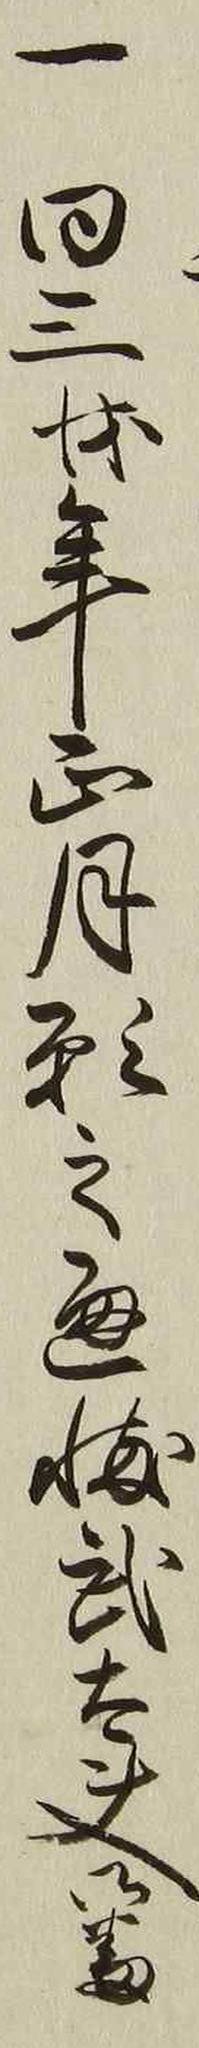一同三戌年正月願之通悴武太夫御番
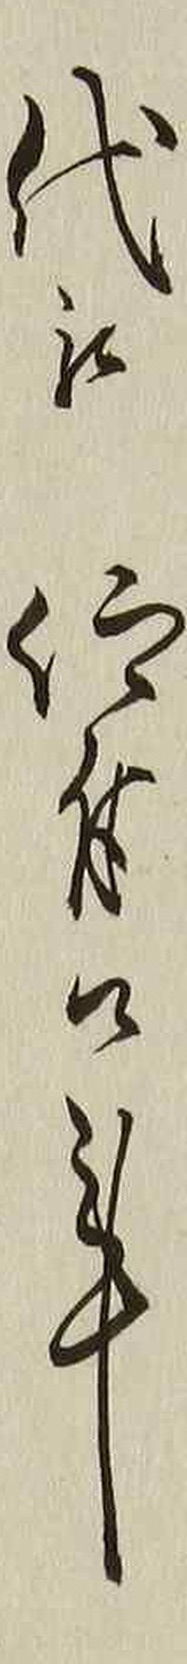代被仰付候事
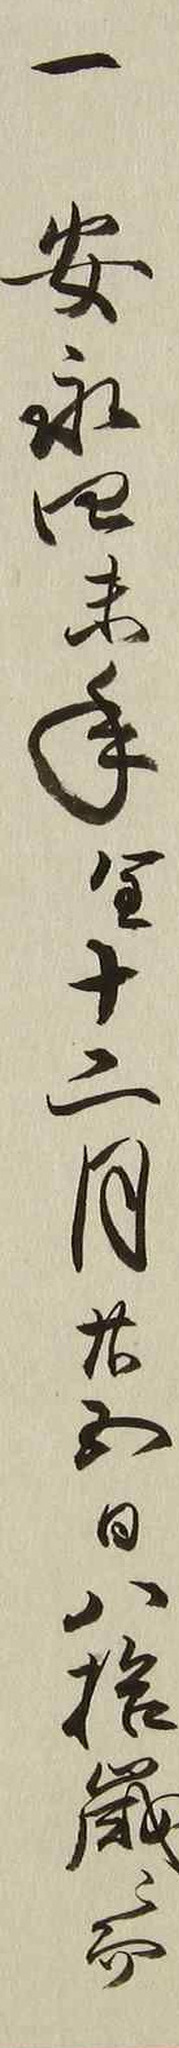一安永四未年閏十二月廿五日八拾歳ニ而
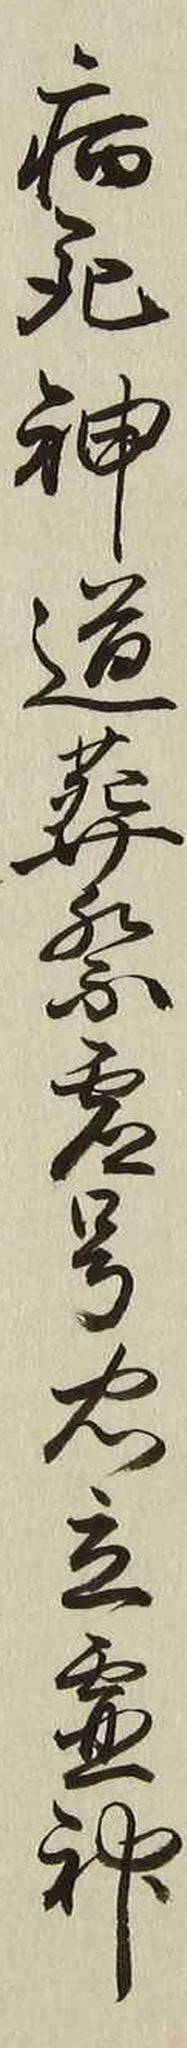病死神道葬祭霊号忠立霊神
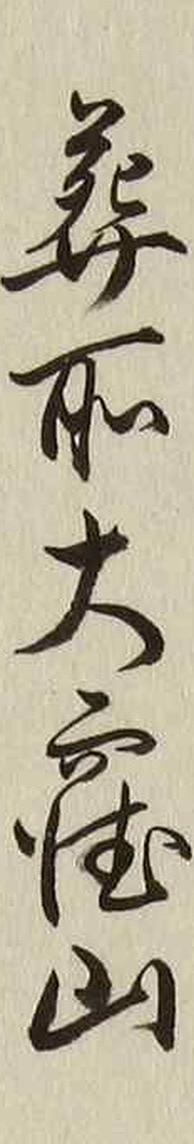葬所大窪山
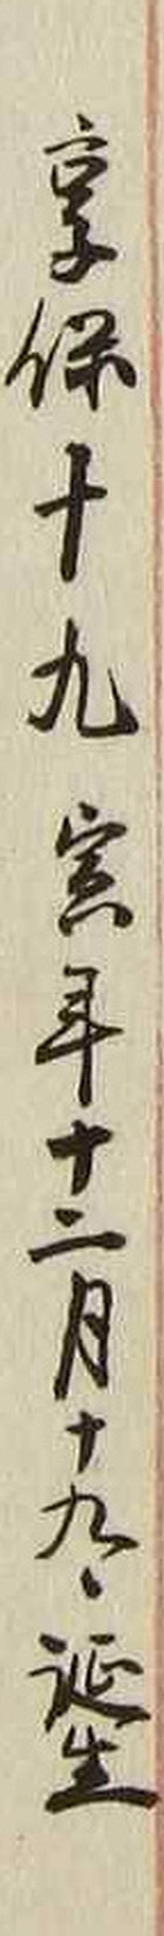享保十九寅年十二月十九日誕生
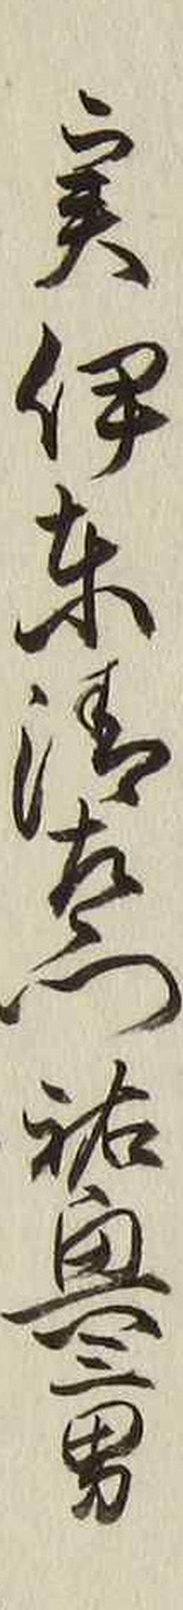実伊東清左衛門祐興三男
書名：諸士系譜　巻之21　い之部21
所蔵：会津若松市立会津図書館
